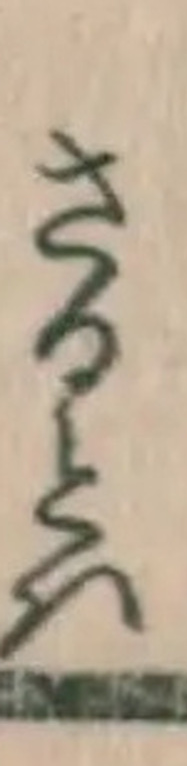さるとは

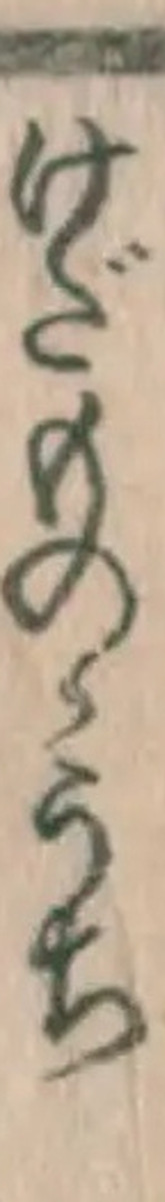けだものゝうち
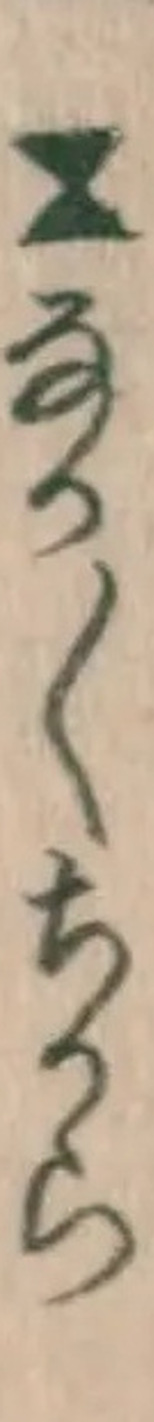▼▲なか〳〵ちから
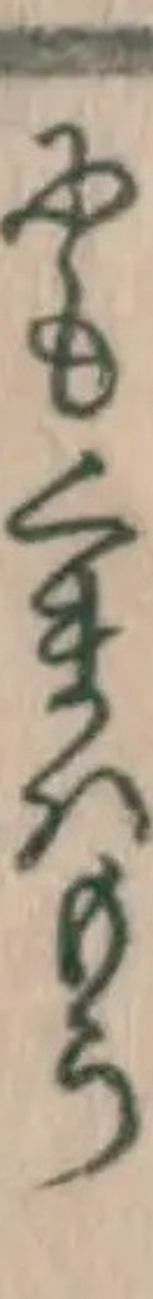にもくまはもう
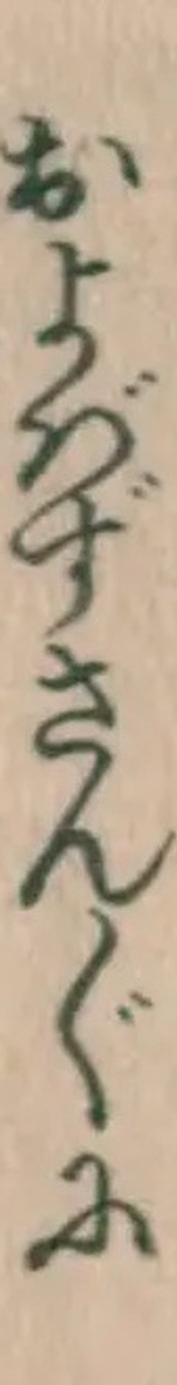およばずさん〴〵に
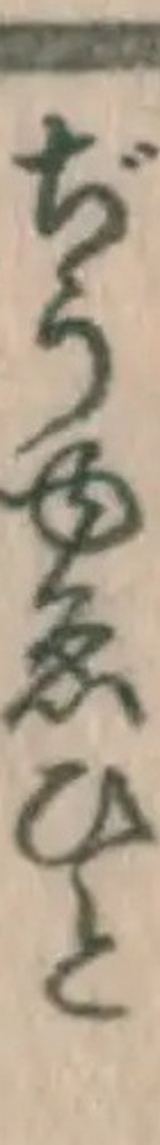ぢうゆゑひと
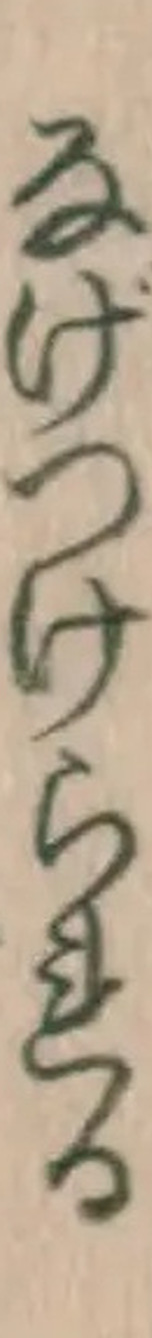なげつけられる
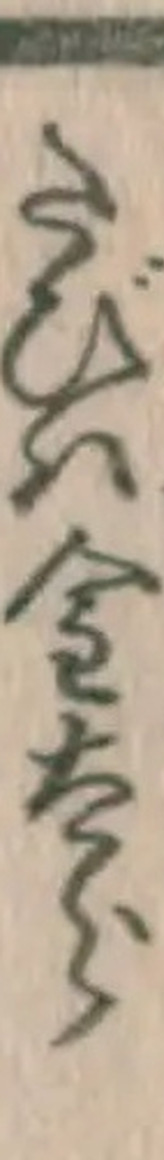たびは金太郎
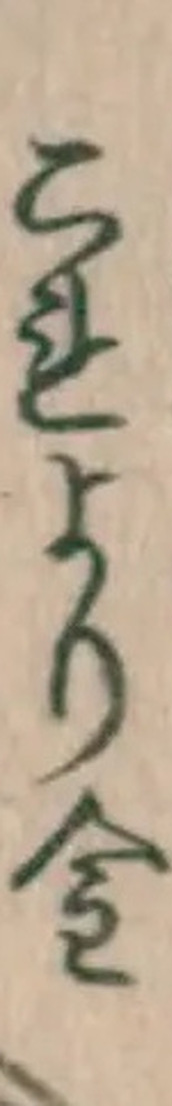これより金
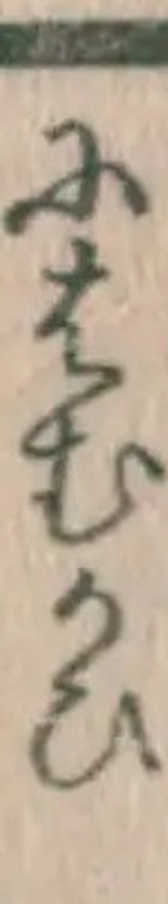にはむかひ
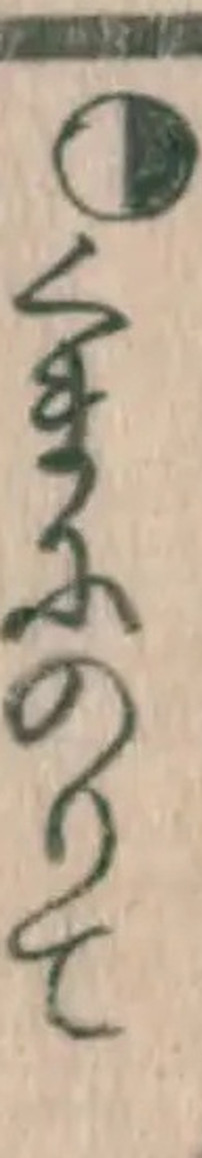◑くまにのりて
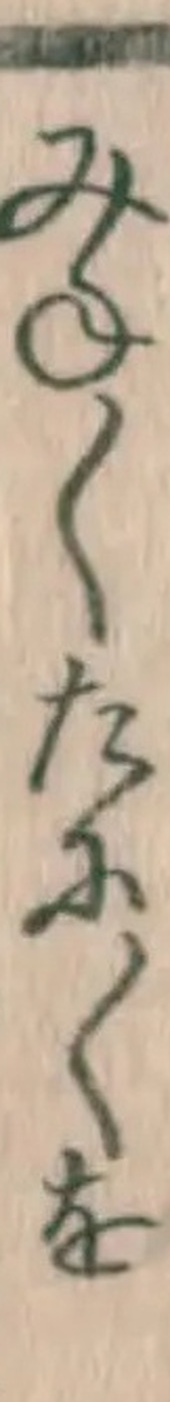みね〳〵たに〳〵を
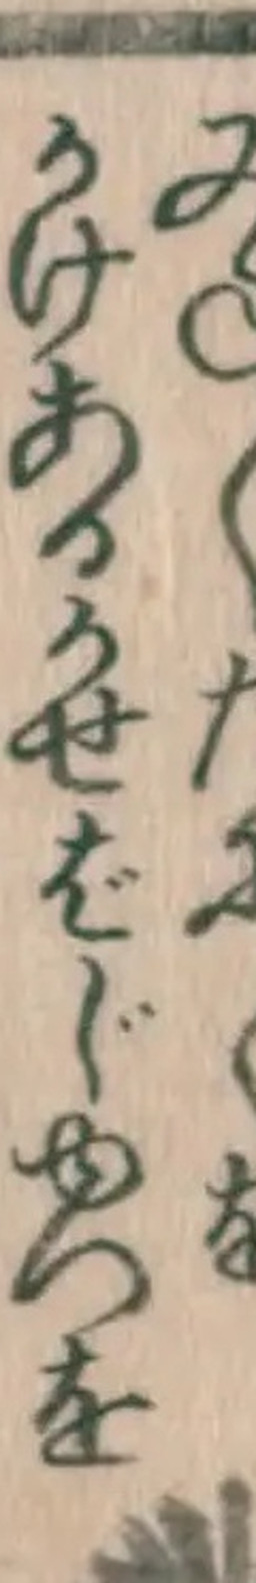かけあるかせばじゆつを
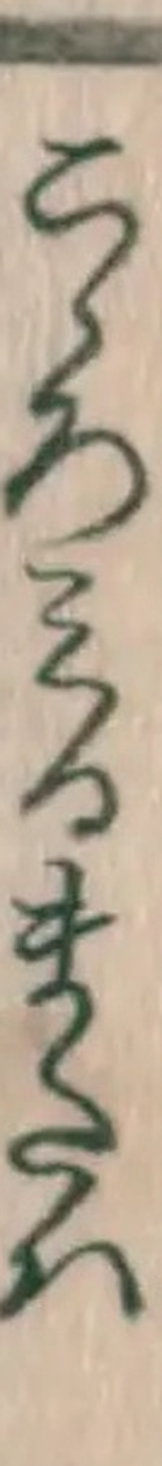こゝろみるまたは
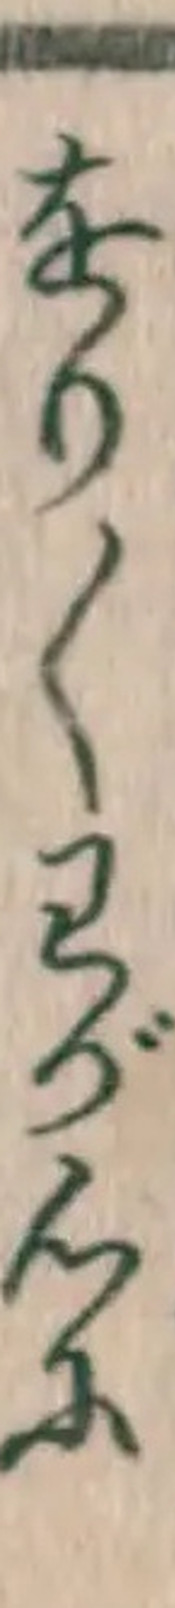をり〳〵わが心に
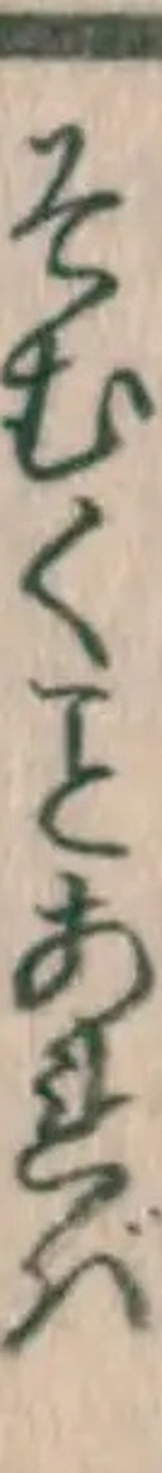そむくことあれば
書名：金太郎
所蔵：国立国会図書館 National Diet Library, JAPAN
